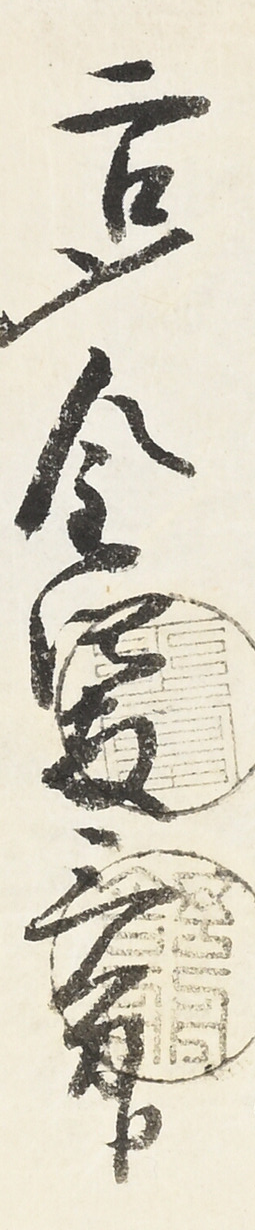二口〆金四両三分ト
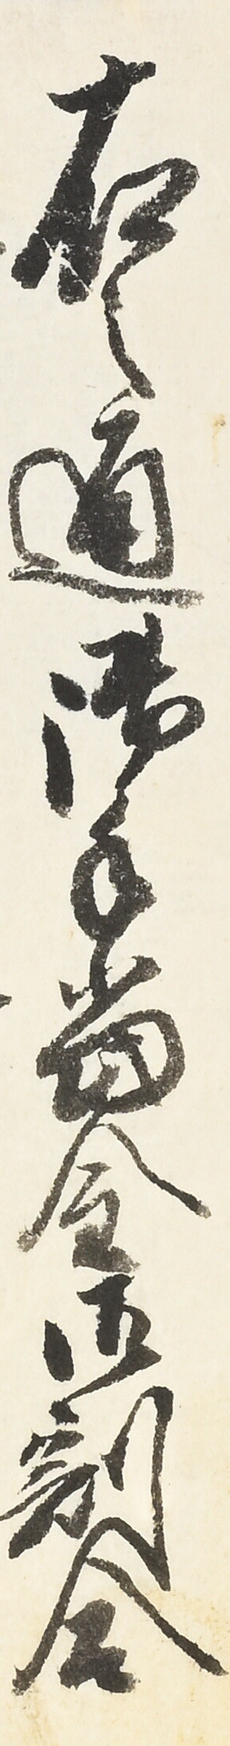右之通御手当金御割合
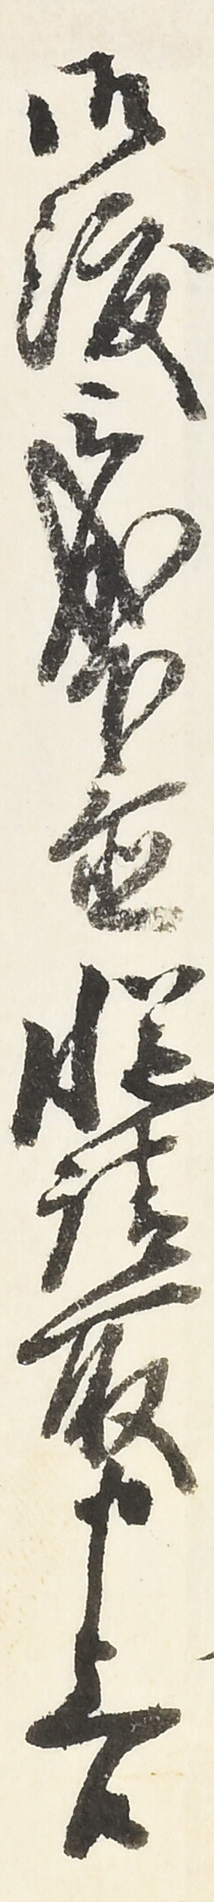御渡被成下置慥請取申上候
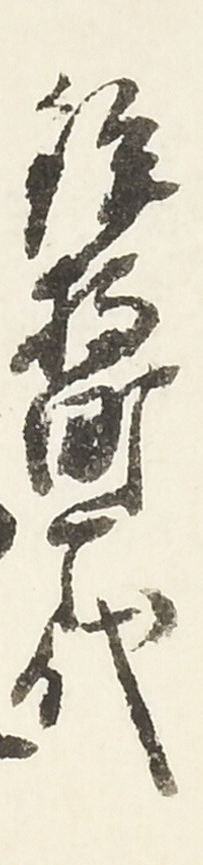鉾持町丁代
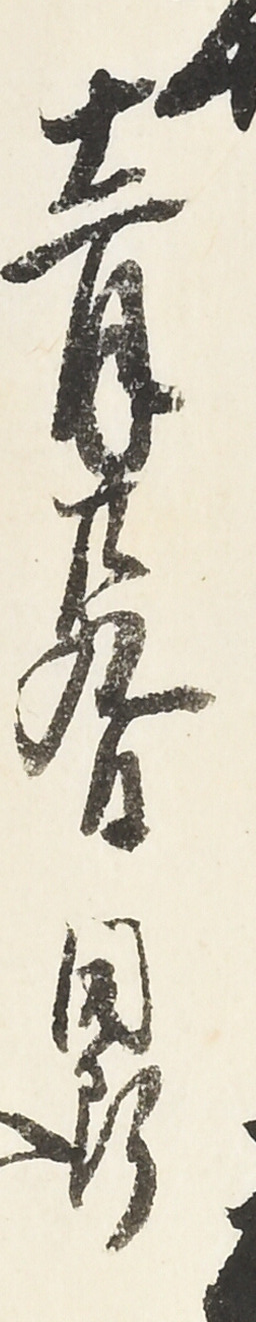十二月廿九日同断
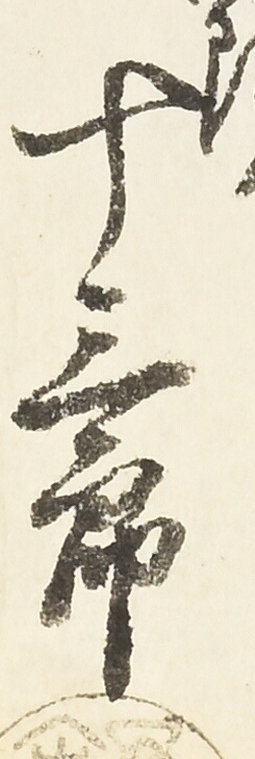十三郎
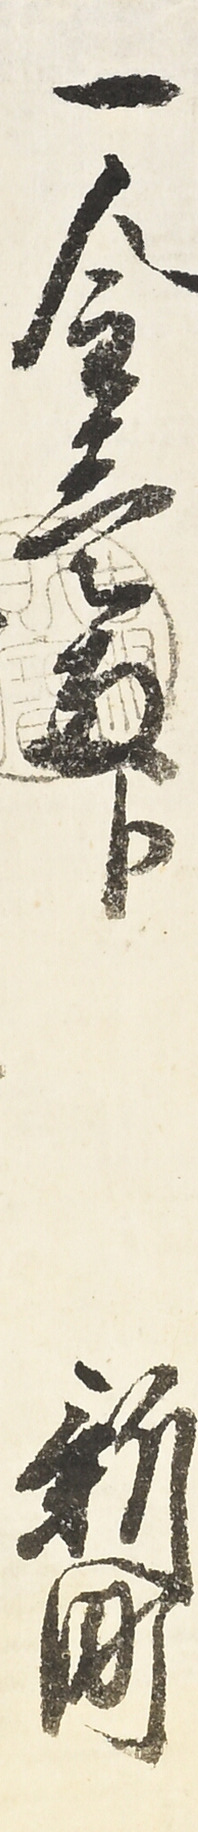一金壱両ト新町
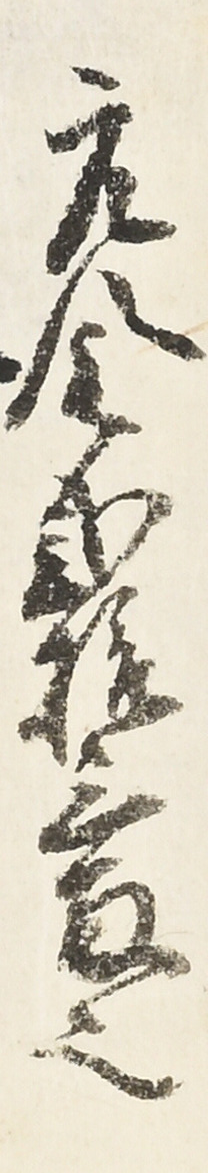元金弐拾三両也
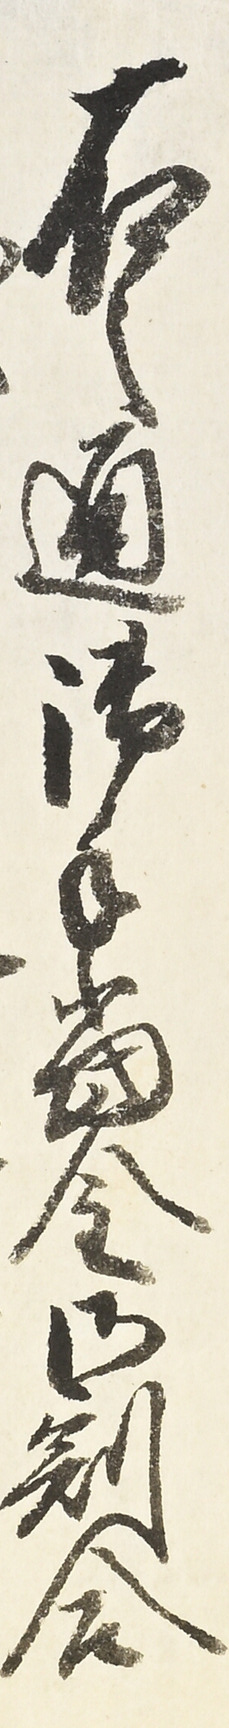右之通御手当金御割合
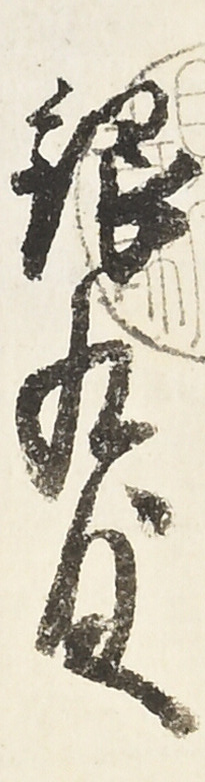銀九匁
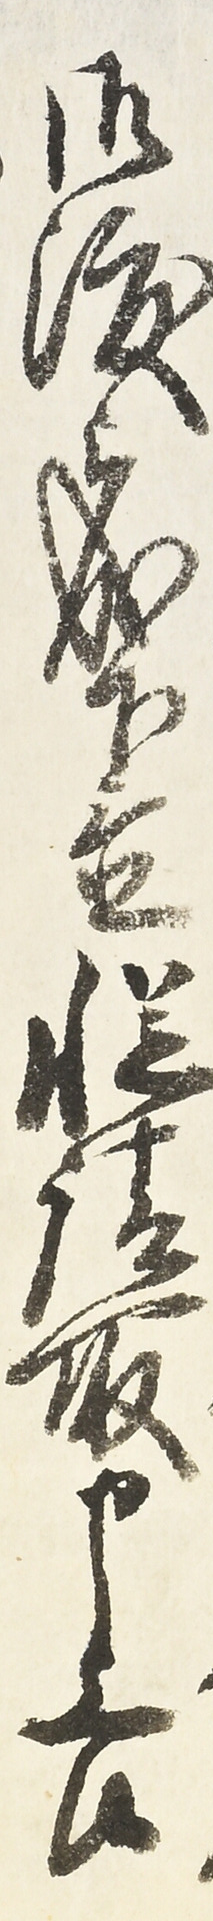御渡被成下置慥請取申上候
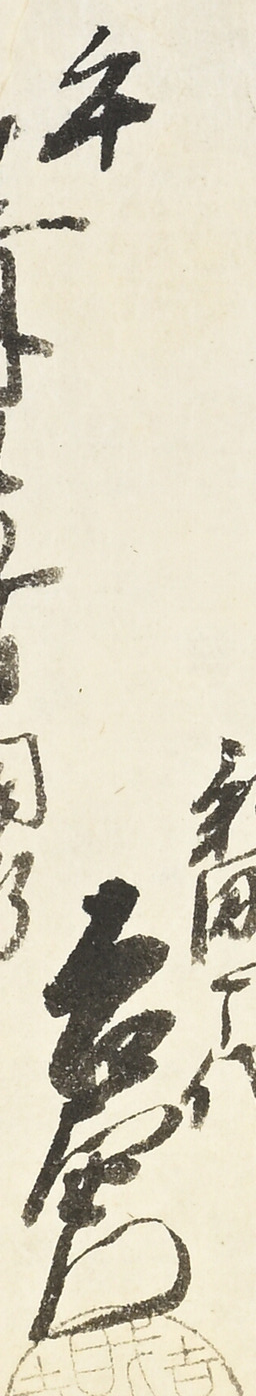午吉右衛門
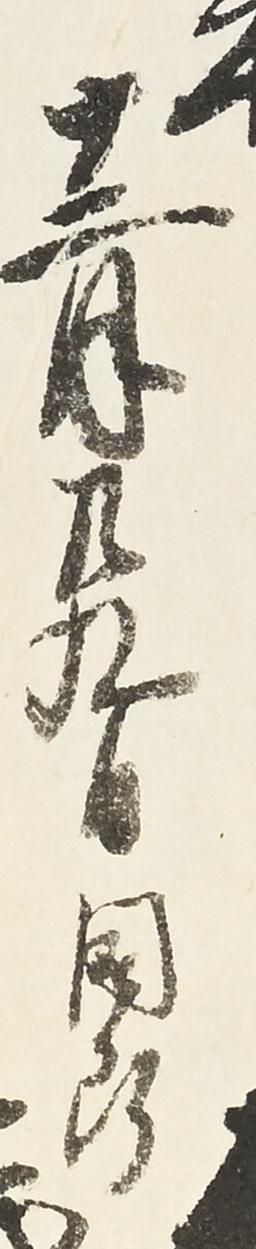十二月廿九日同断
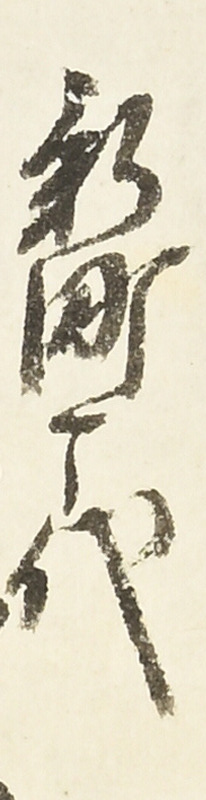新町丁代
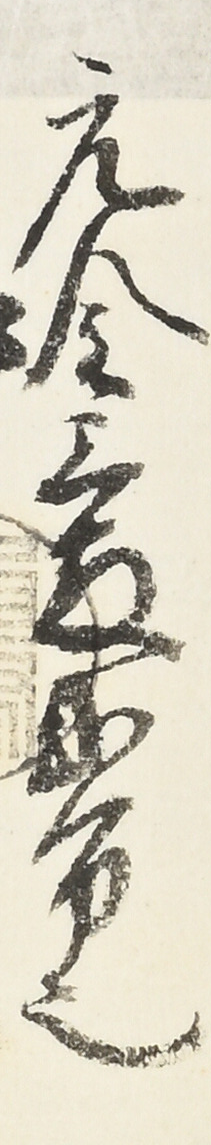元金三両弐分也
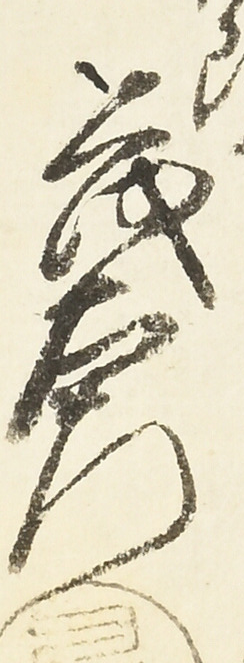茂右衛門
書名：御才覚金御利足割渡扣帳
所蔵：伊那市立高遠町図書館・合同会社AMANE
